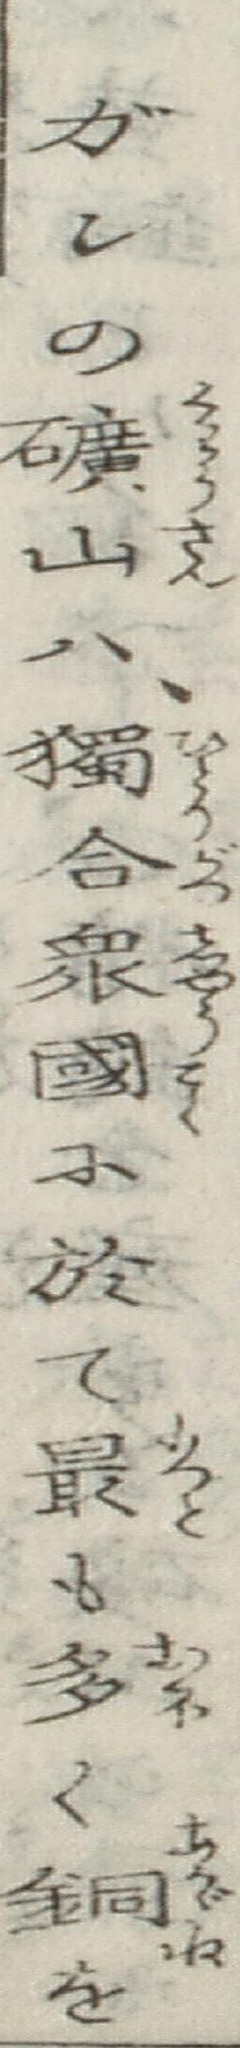ガンの砿山は、独合衆国に於て最も多く銅を
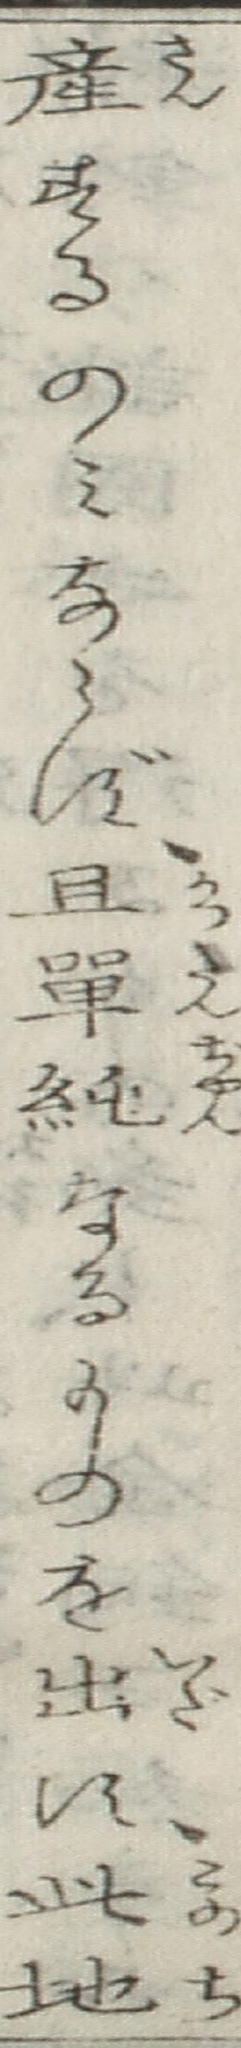産するのみならず、且単純なるものを出す、此地
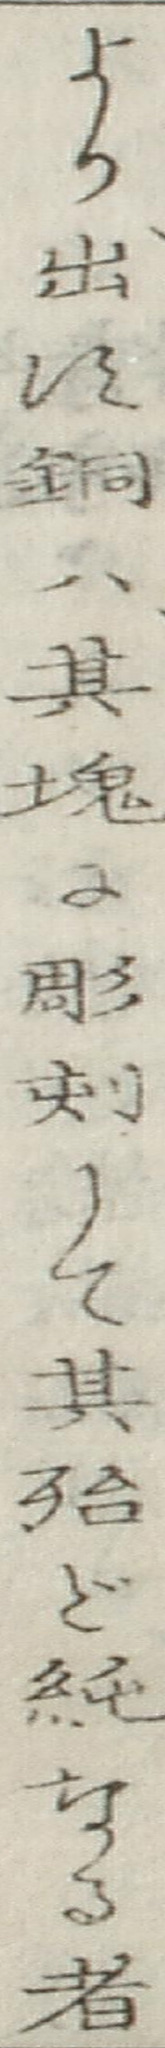より出す銅は、其塊に彫刻して其殆ど純なる者
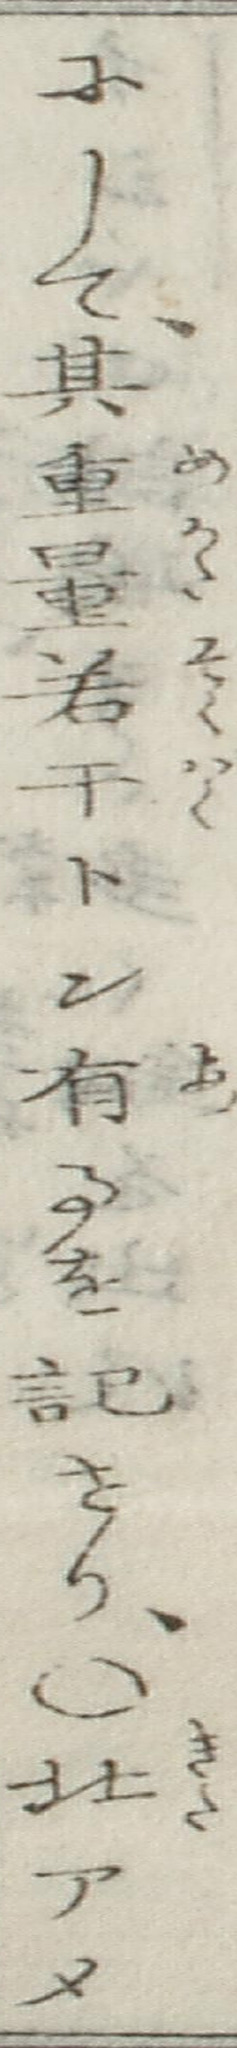にして、其重量若干トン有るを記せり、○北アメ
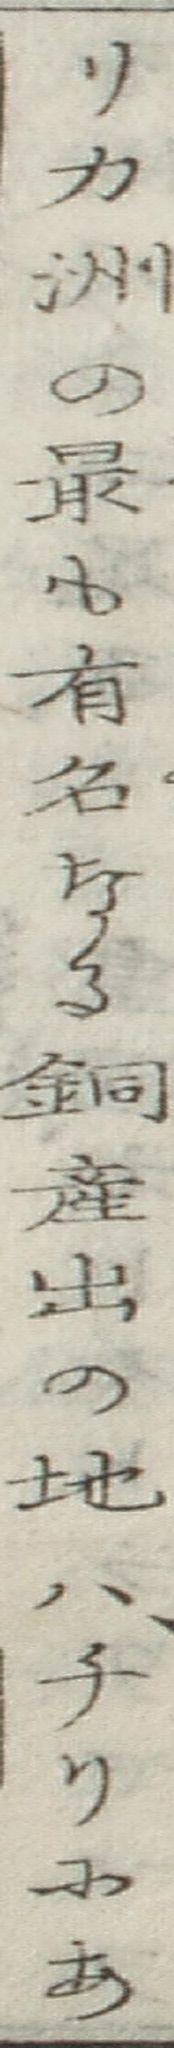リカ洲の最も有名なる銅産出の地は、チリにあ
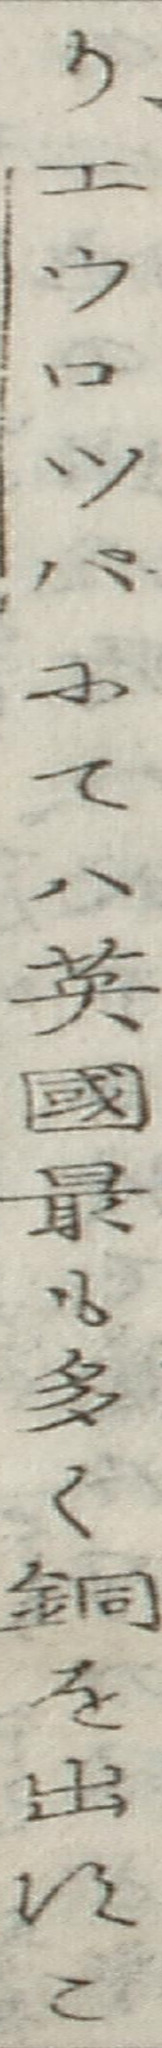り、エウロツパにては、英国最も多く銅を出す、こ

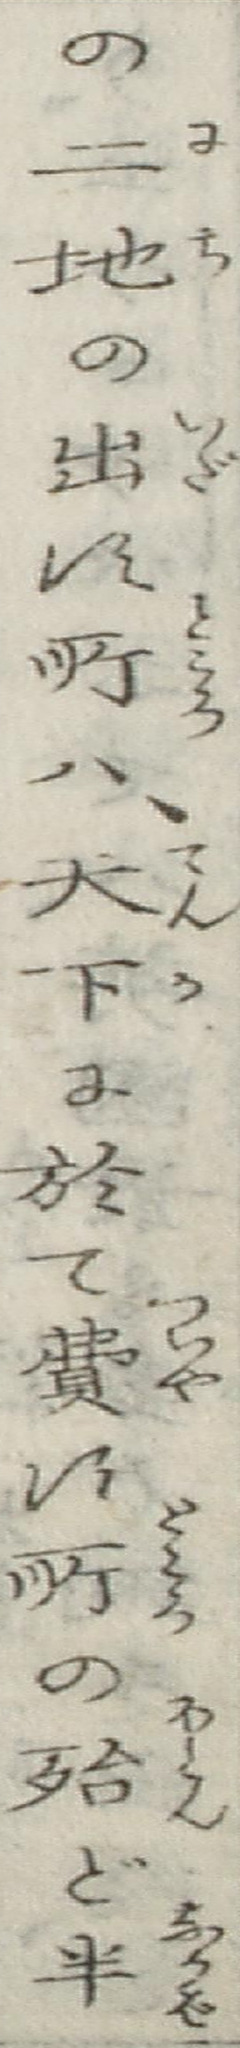の二地の出す所は、天下に於て費す所の殆ど半
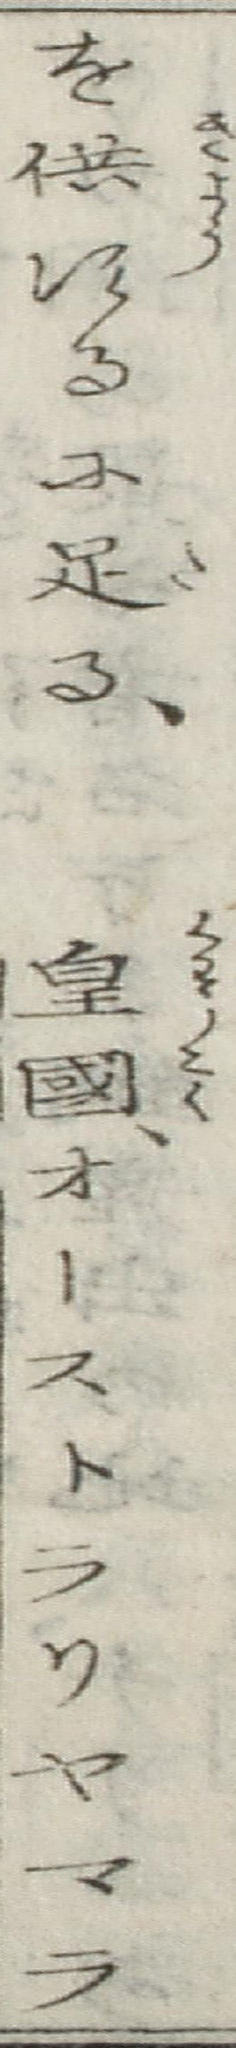を供するに足る、皇国、オーストラリヤマラ
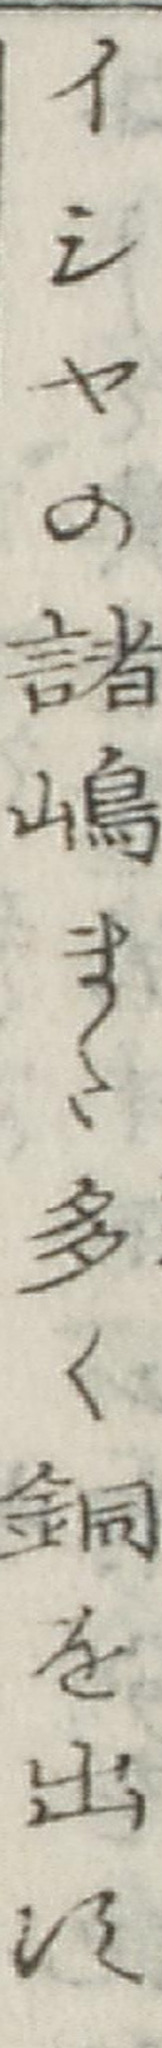イシヤの諸島、また多く銅を出す
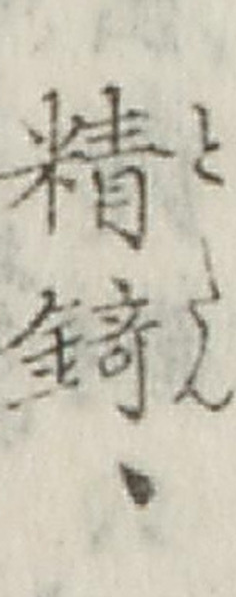精錡、
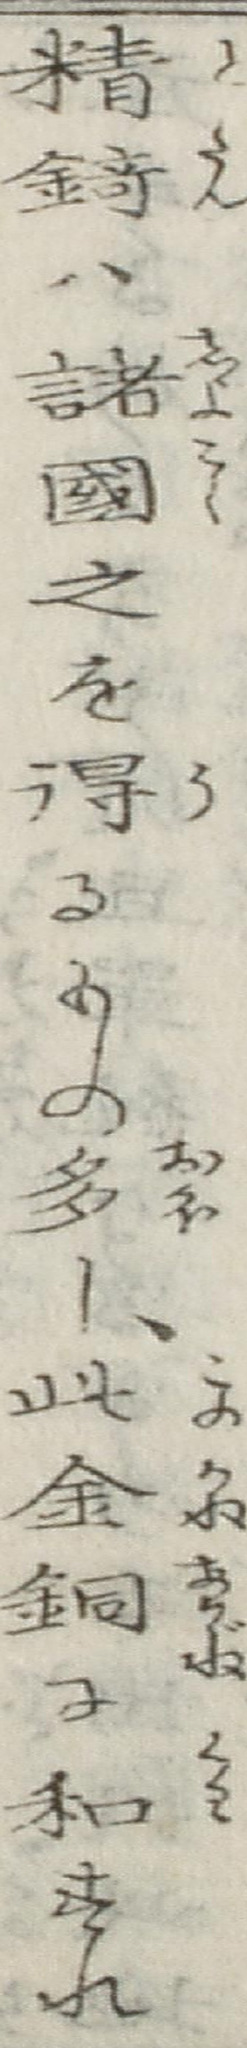精錡は諸国之を得るもの多し、此金銅に和すれ
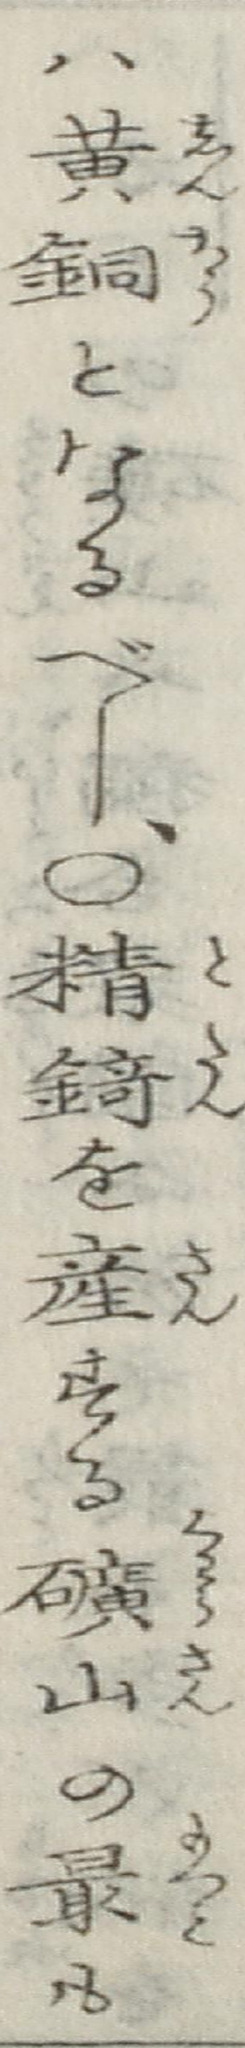は黄銅となるべし、〇精錡を産する鉱山の最も
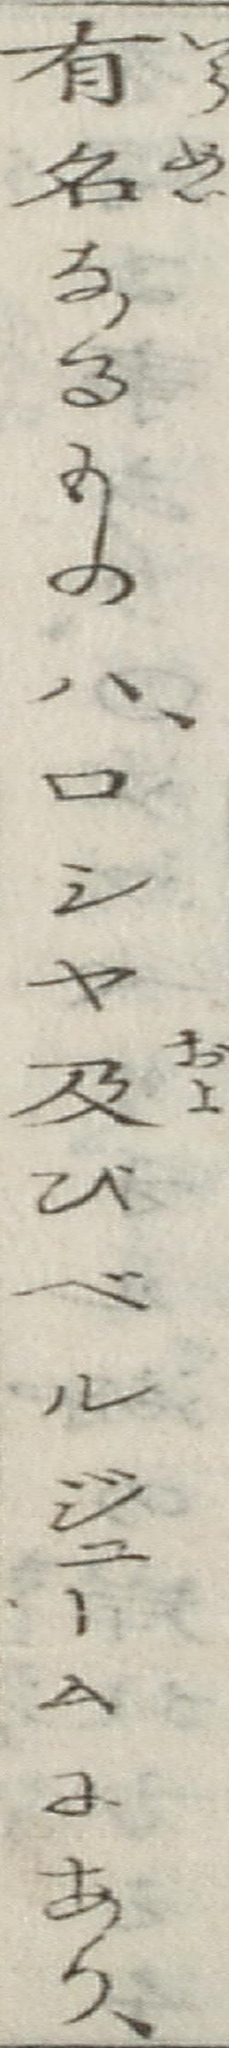有名なるものは、ロシヤ及びベルジュームにあり、
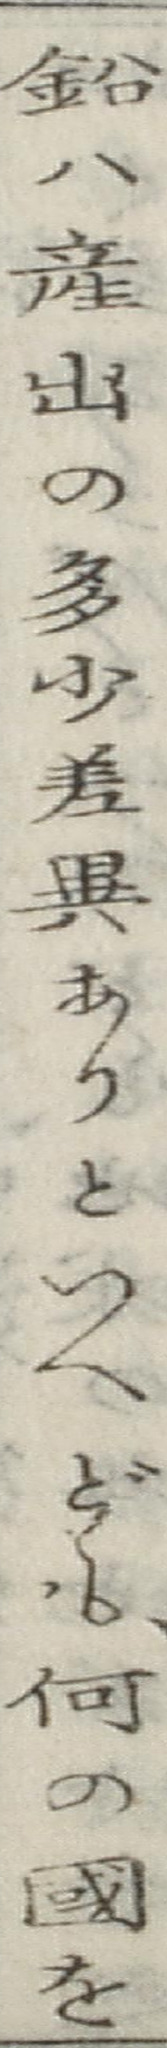鉛は産出の多少差異ありといへども、何の国を
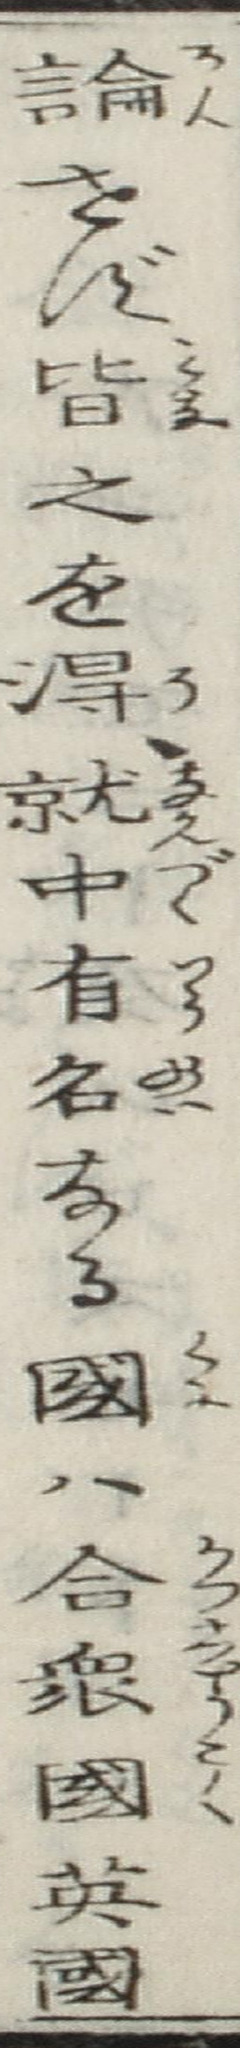論せず皆之を得、就中有名なる国は合衆国英国
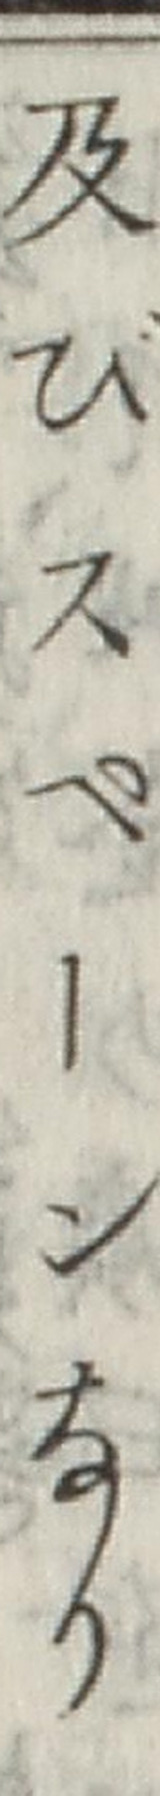及びスペーンなり
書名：訓蒙　天然地理學　下
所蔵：東京大学地震研究所図書室 Earthquake Research Institute Library, The University of Tokyo, JAPAN
